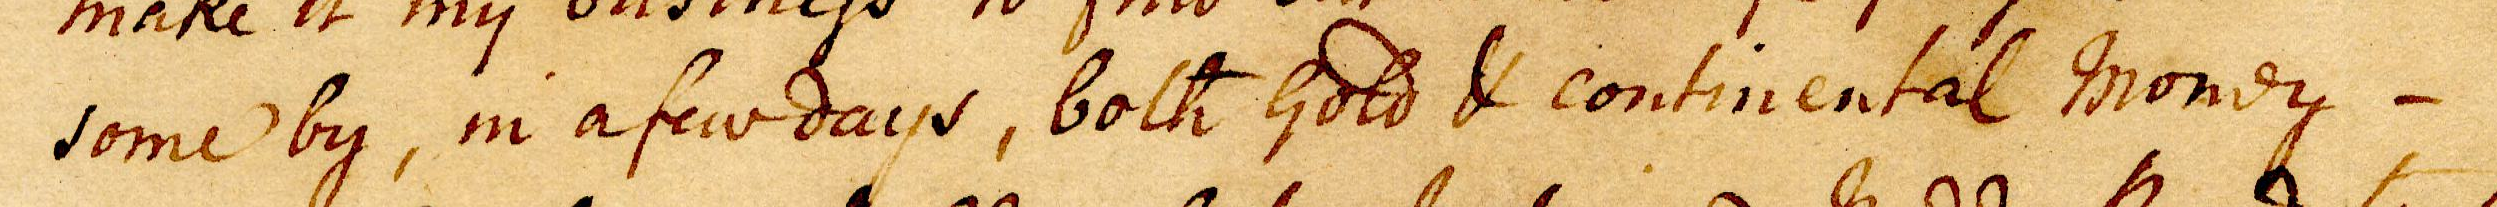some by, in a few days, both Gold & continental Money-
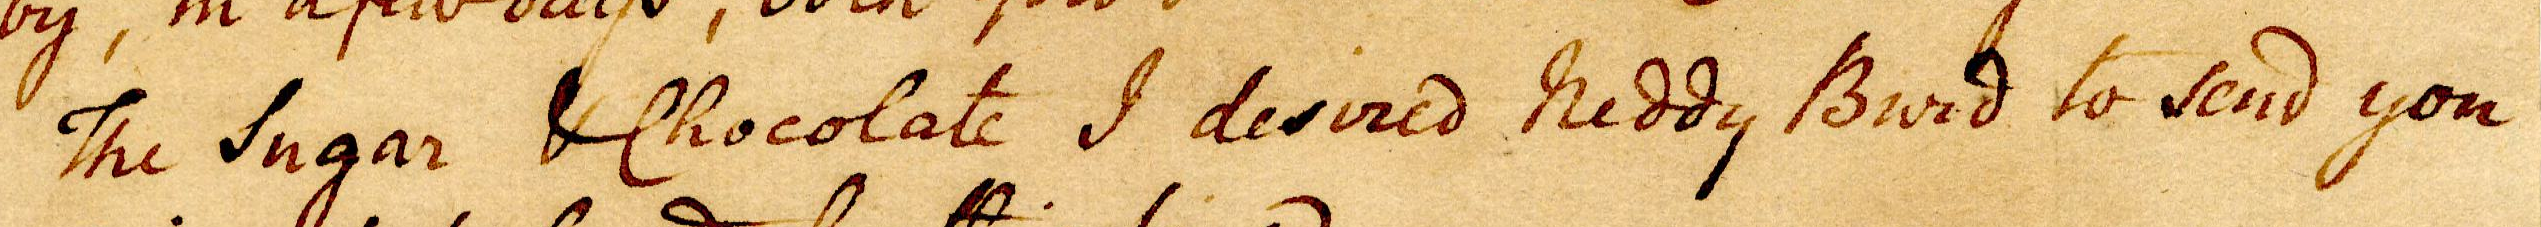The Sugar & Chocolate I desired Neddy Burd to send you
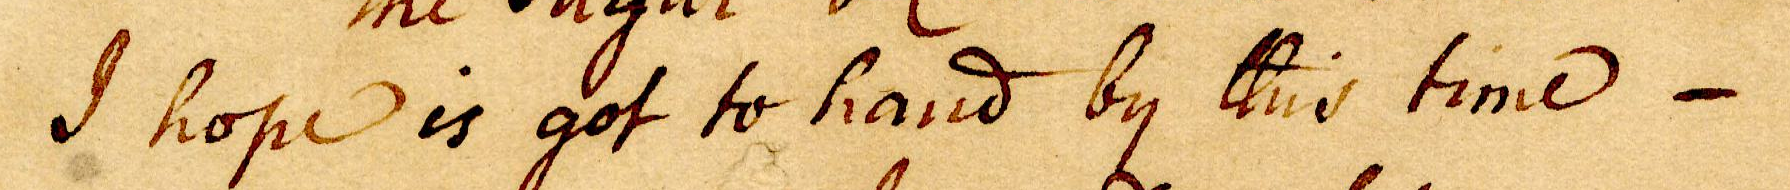I hope is got to hand by this time-
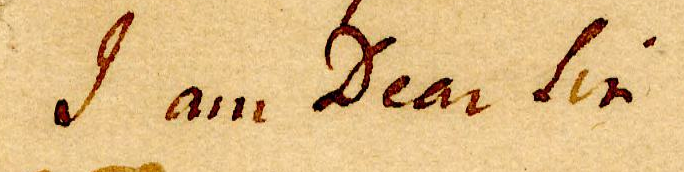I am Dear Sir
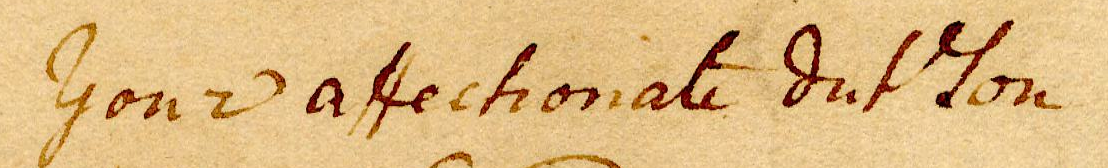Your affectionate dut Son
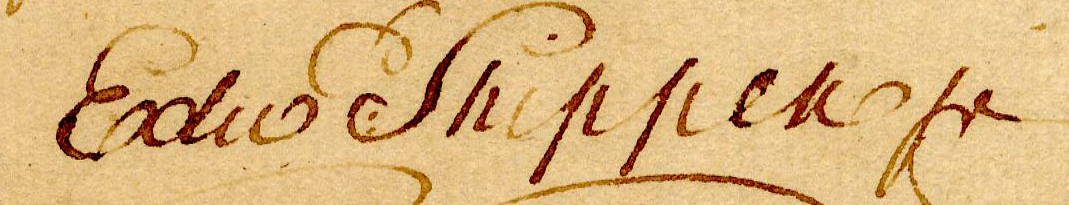Edw^d: Shippen jr
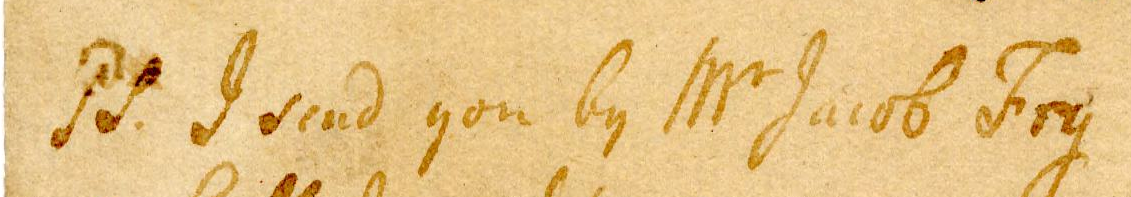PS. I send you by M^r Jacob Fry
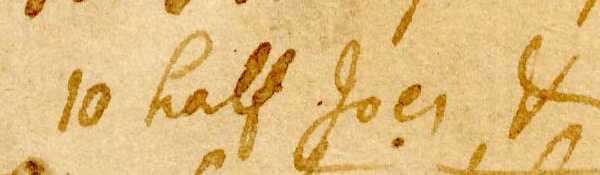10 half Joes &
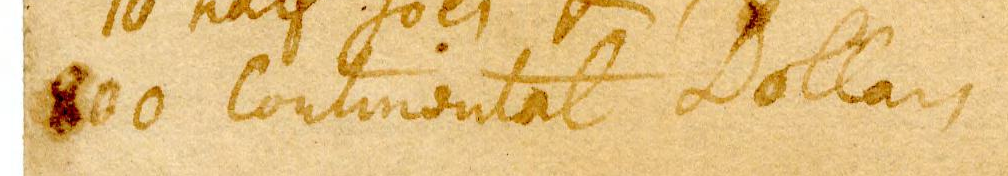800 Continental Dollars
